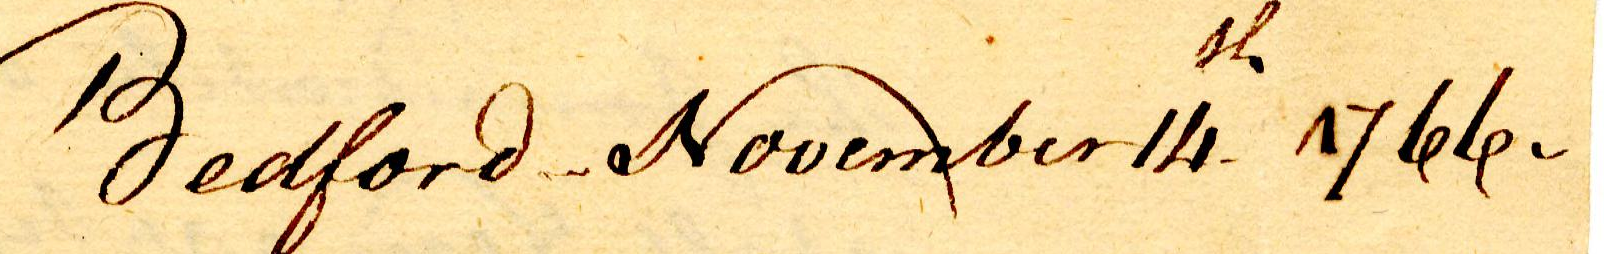Bedford November 14^th 1776-
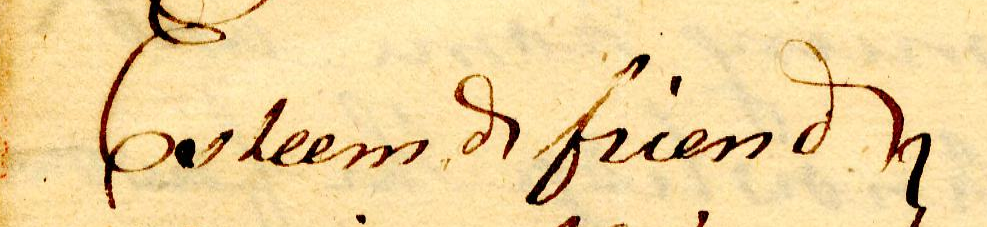Esteemd friend
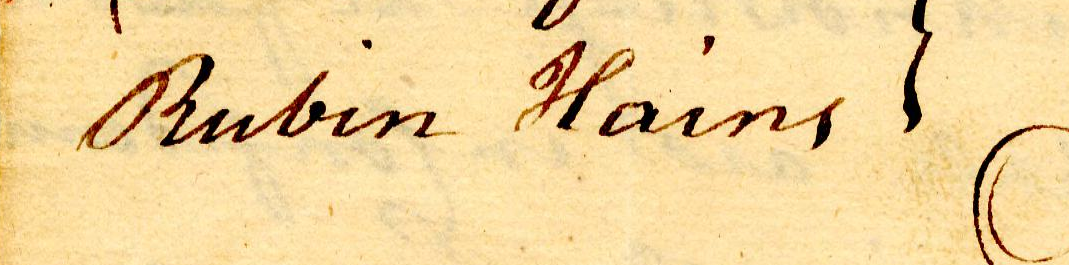Rubin Hains
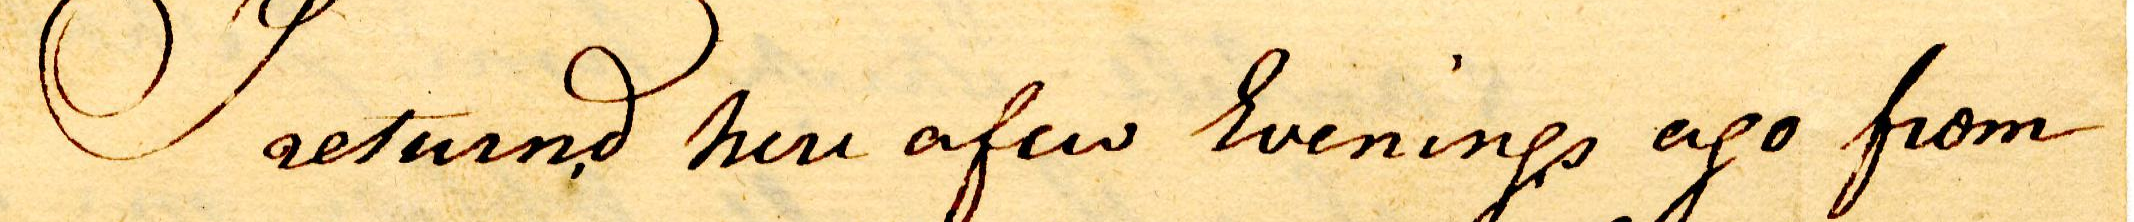I return'd here a few Evenings ago from
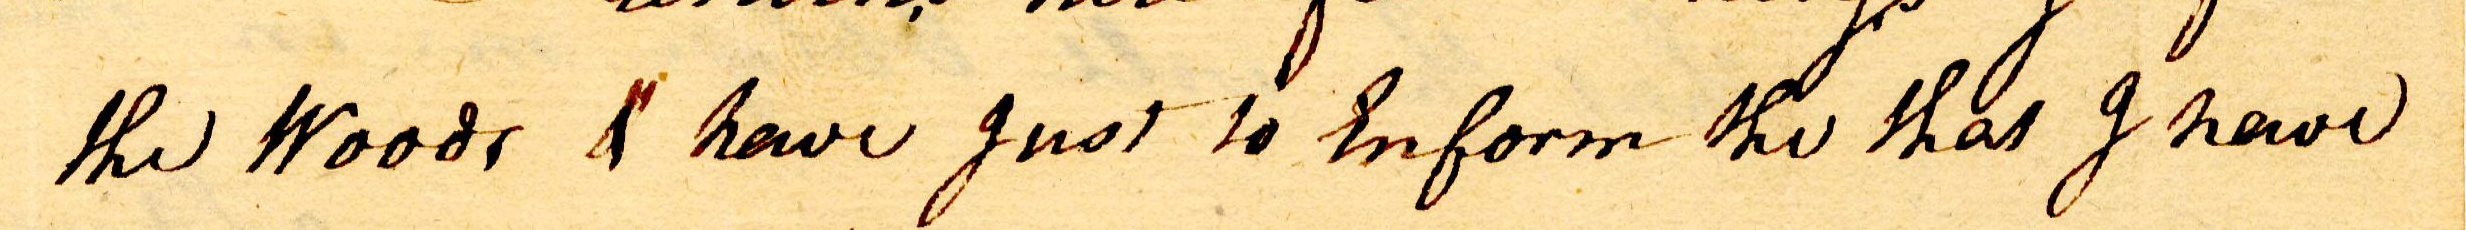the Woods & have Just to Enform the that I have
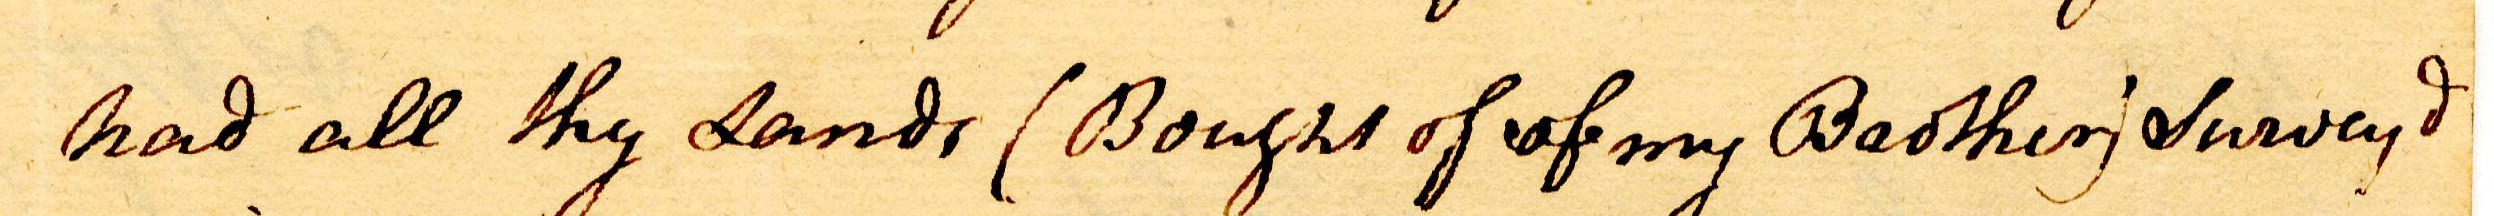had all thy Lands (bought of of my Brother) surveyd
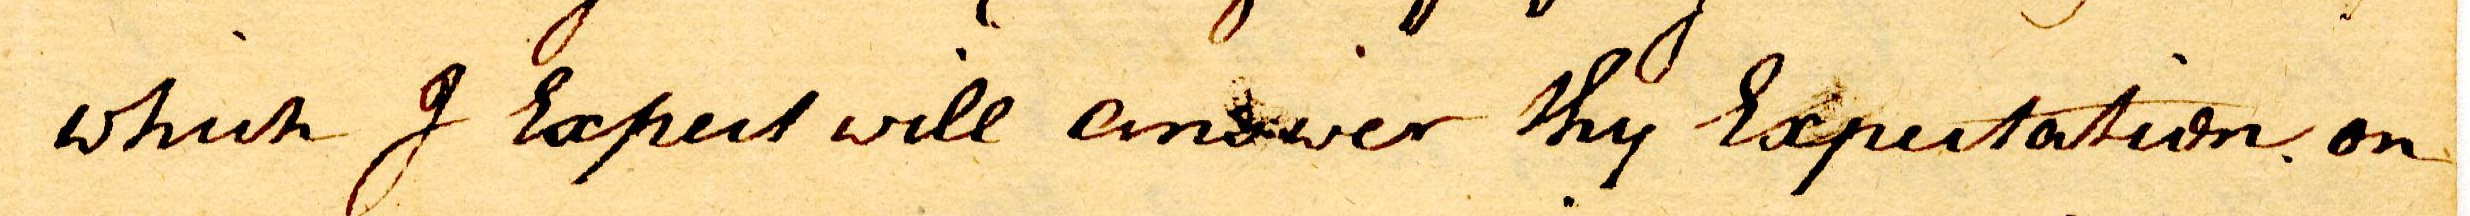which I Expect will answer thy Expectation on
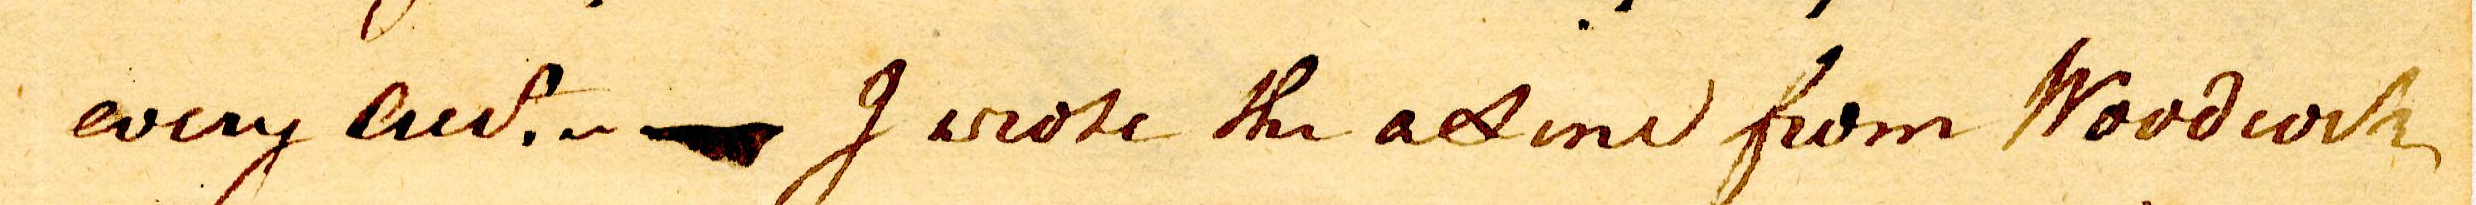every Acc^t.- I wrote the a Line from Woodcock
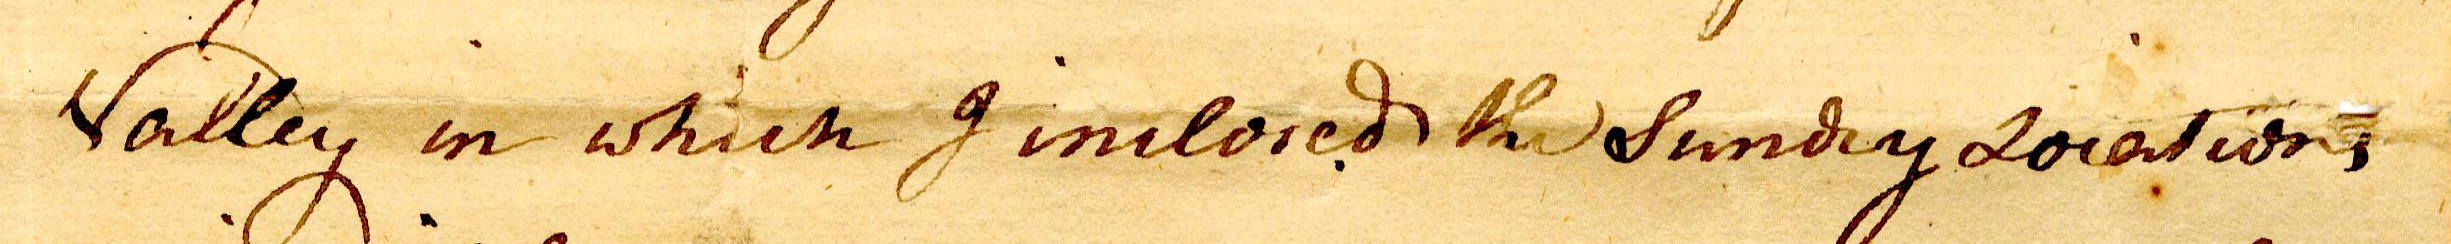Valley in which I inclosed the Sundry Locations
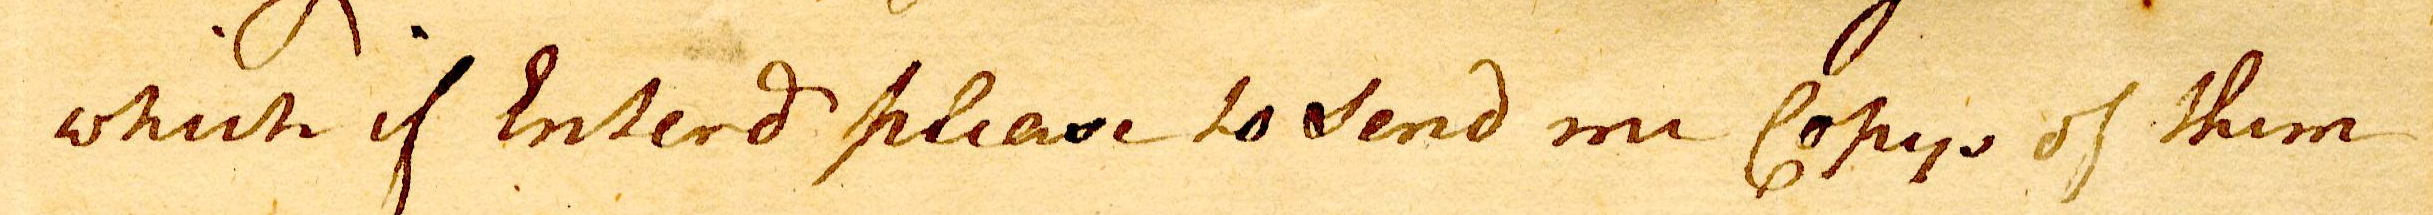which if Enterd please to send me Copys of them
